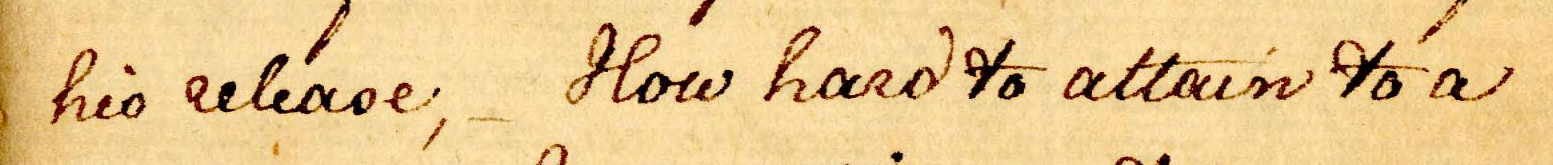his release,- How hard to attain to a
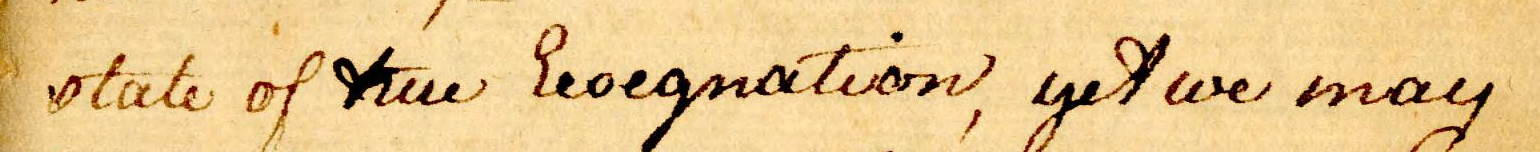state of true Resegnation, yet we may
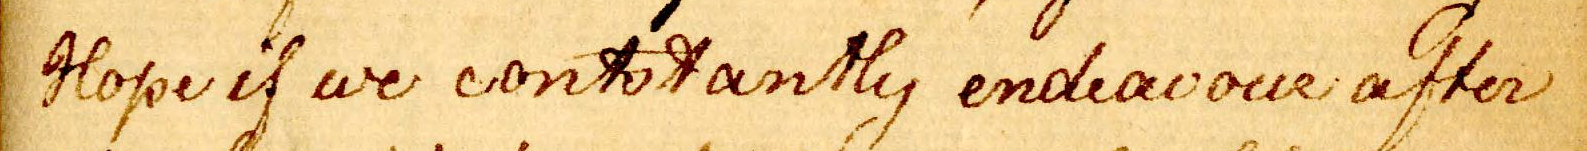Hope if we contstantly endeavour after
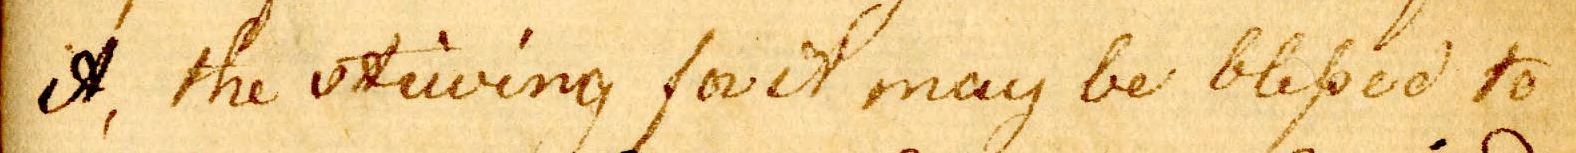it, the striving for it may be blessed to
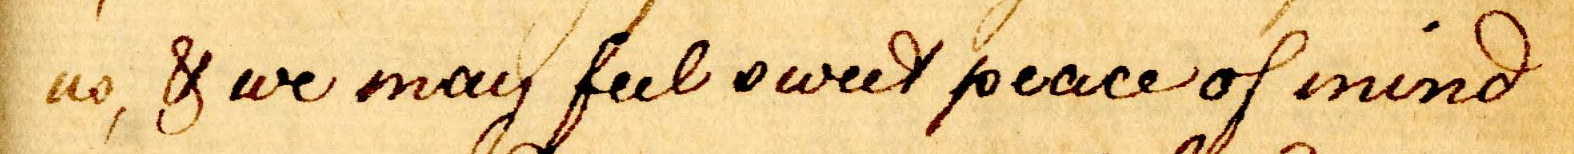us, & we may feel sweet peace of mind
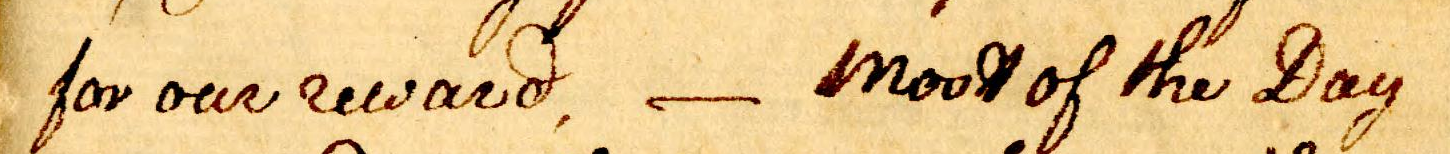for our reward- Most of the Day
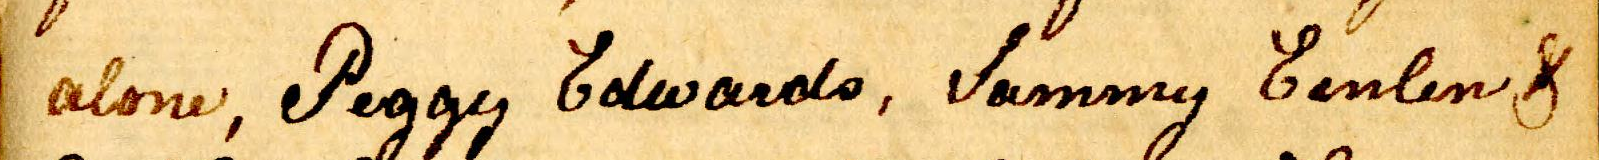alone, Peggy Edwards, Sammy Emlen &
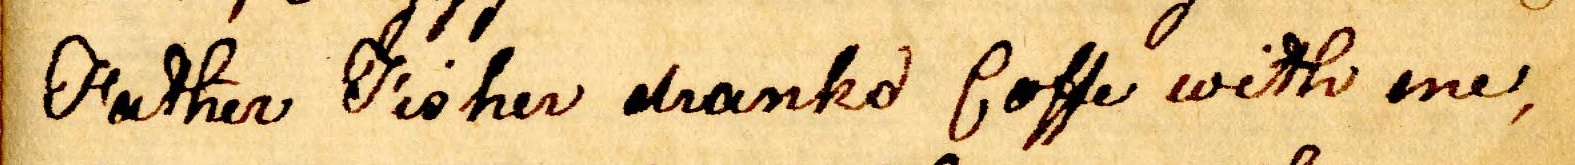Father Fisher drankd Coffe with me,
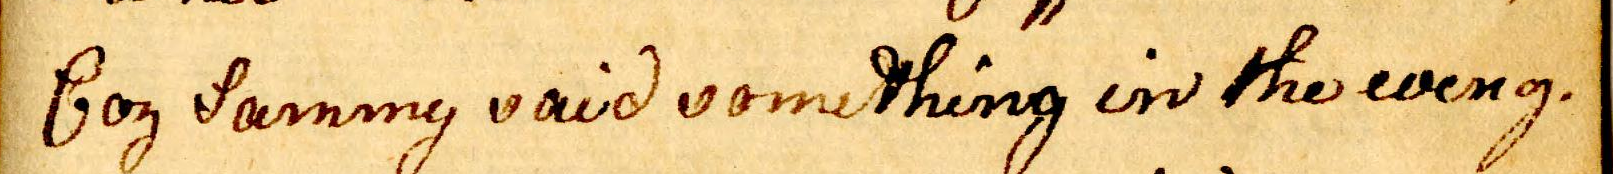Coz Sammy said something in the eveng.
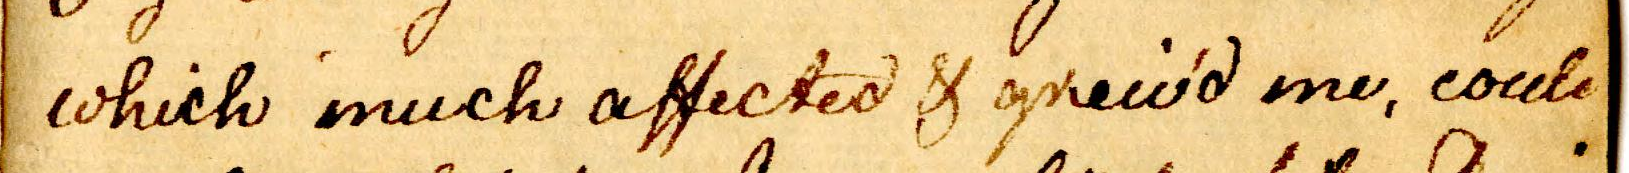which much affected & greiv'd me, could
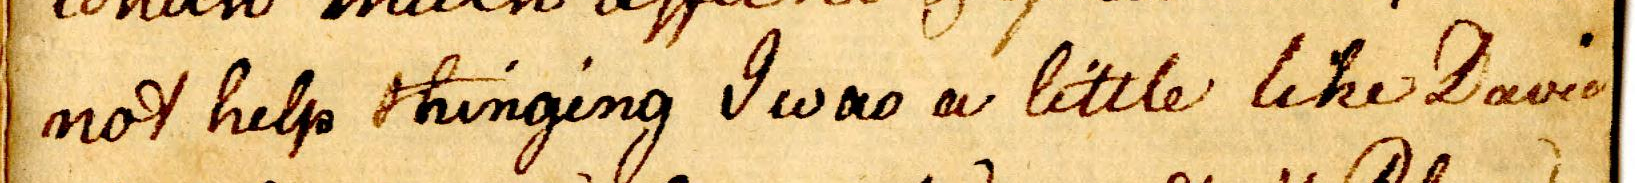not help thinging I was a little like David
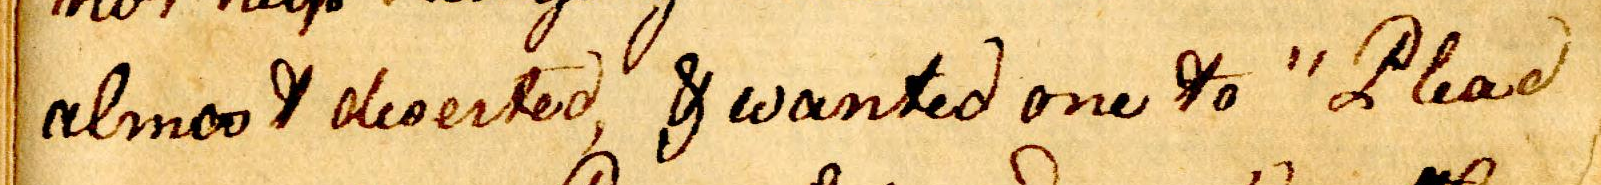almost deserted, & wanted one to "Plead
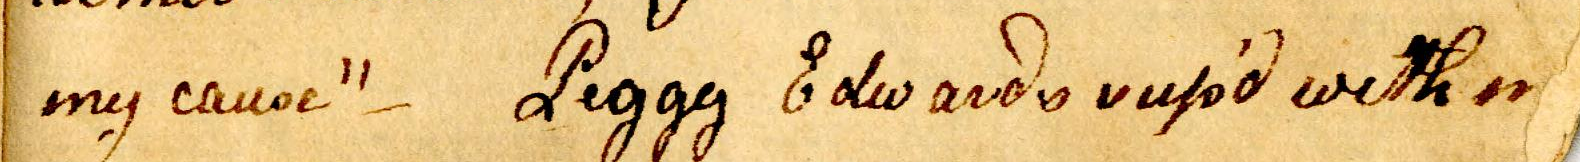my cause"- Peggy Edwards sup'd with m
